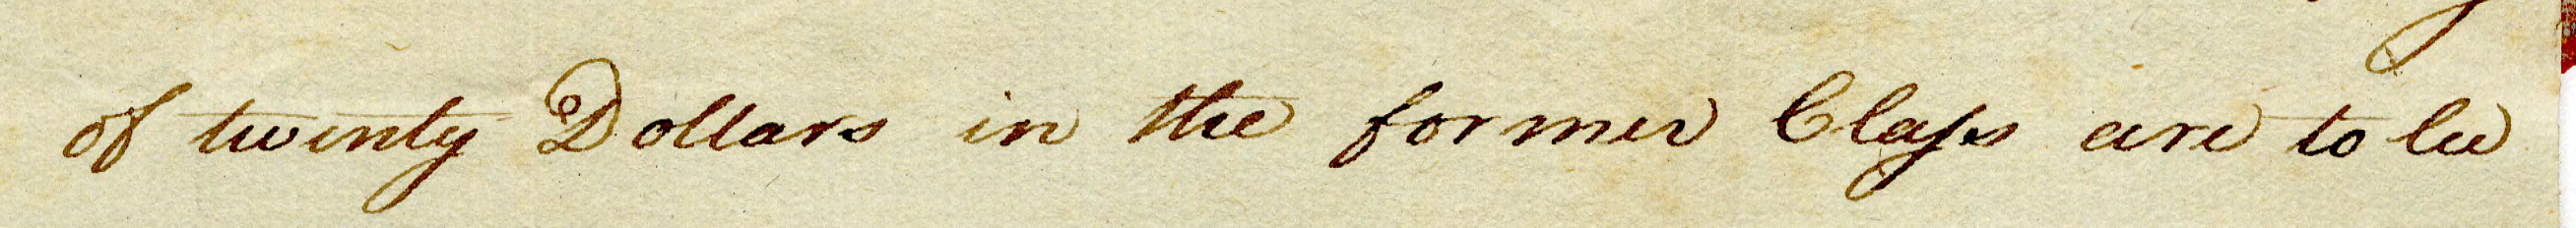of twenty Dollars in the former Class are to be
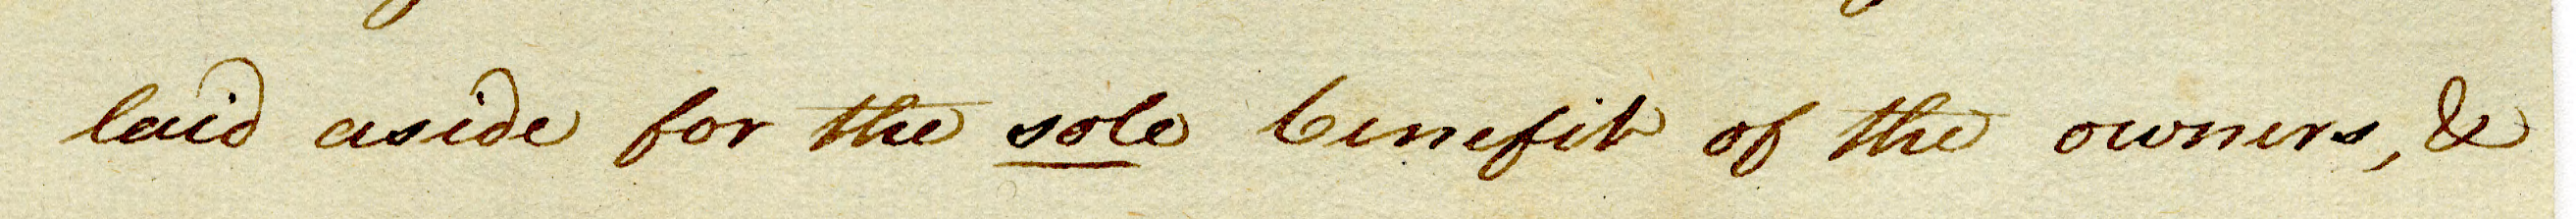laid aside for the sole benefit of the owners, &
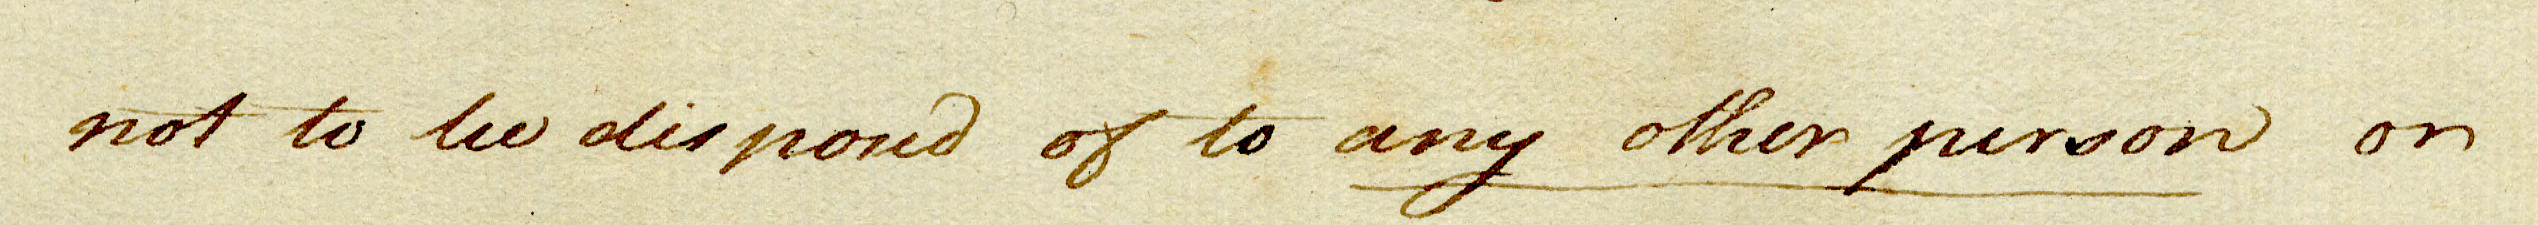not to be disposed of to any other person or
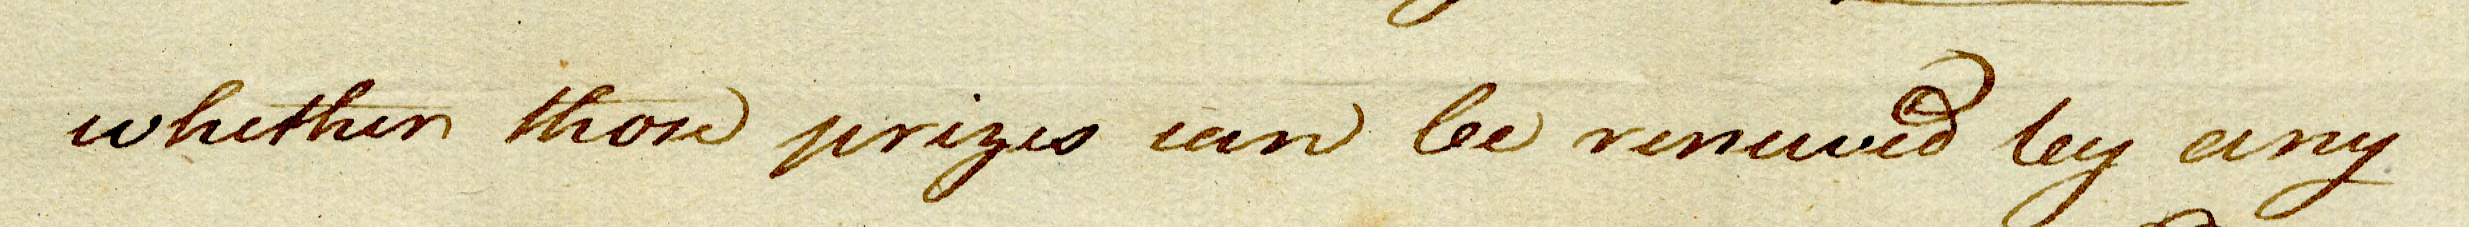whether those prizes can be renewed by any
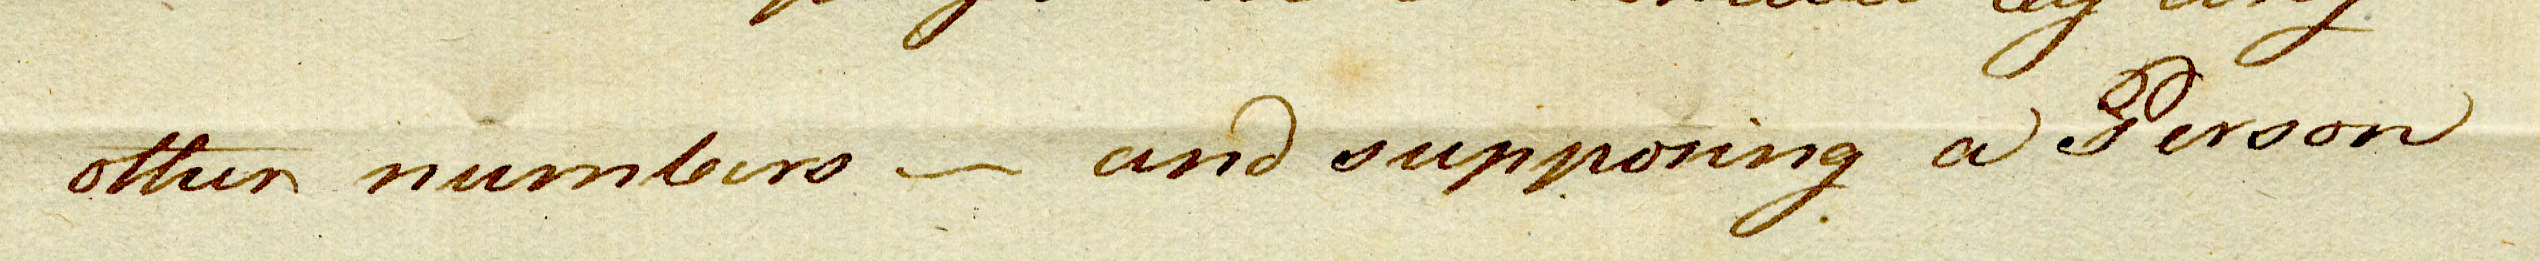other numbers- and supposing a Person
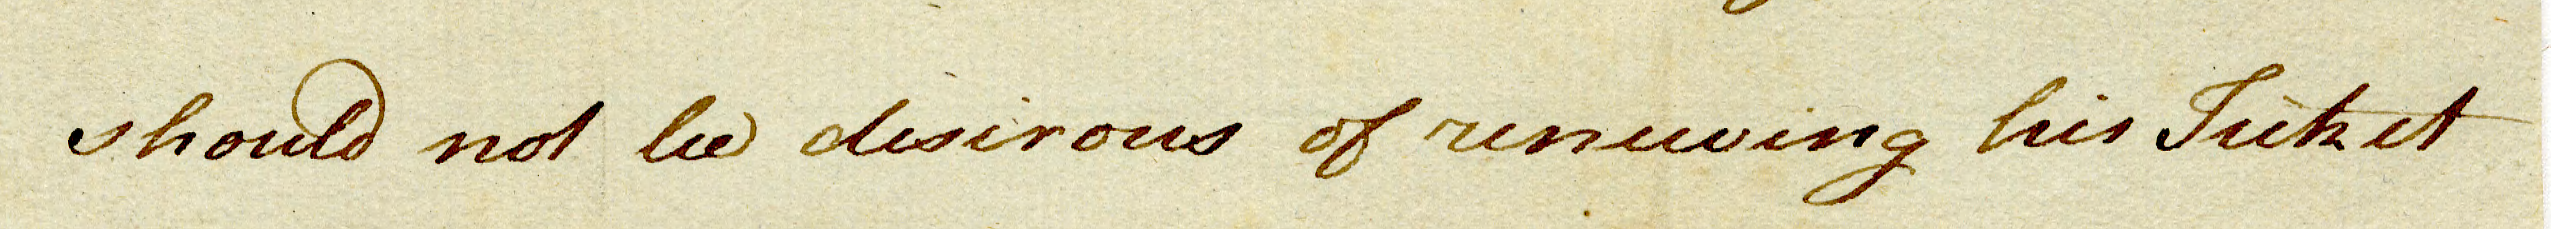should not be desirous of renewing his Ticket
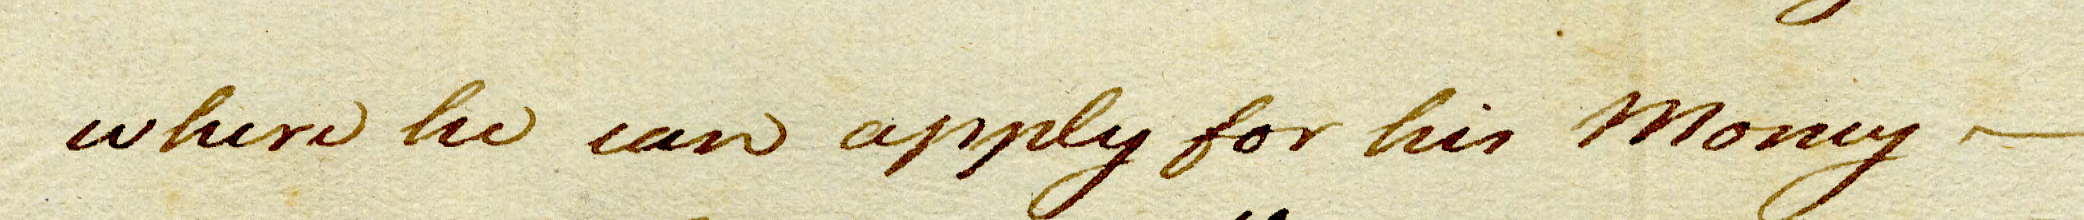where he can apply for his Money-
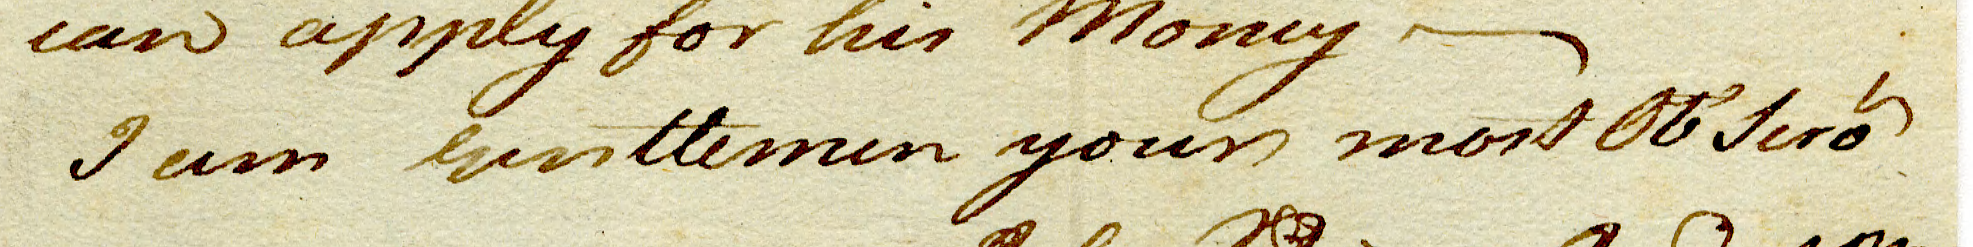I am Gentlemen you most Ob Serv^t
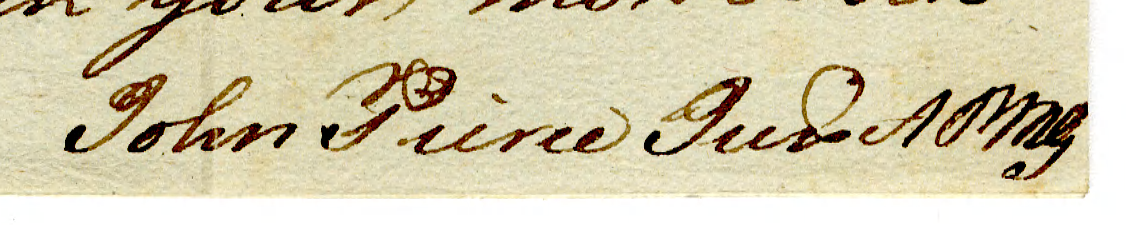John Pierce Jun^r APMG
